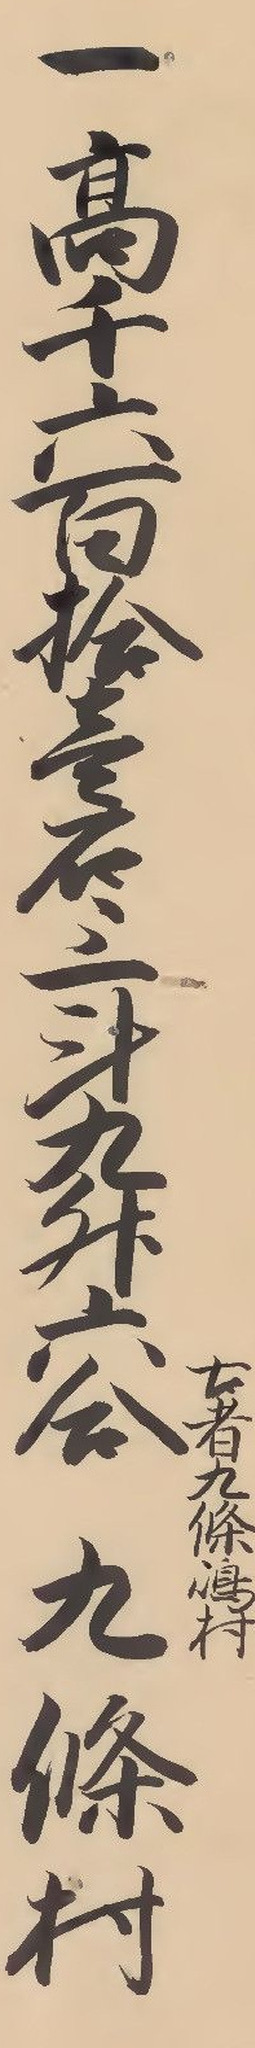一高千六百拾壱石三斗九升六合九条村
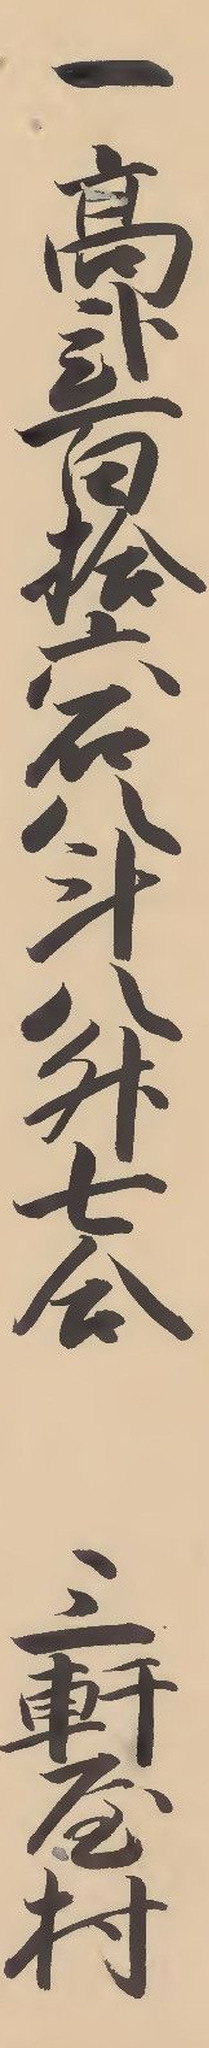一高弐百拾六石八斗八升七合三軒屋村
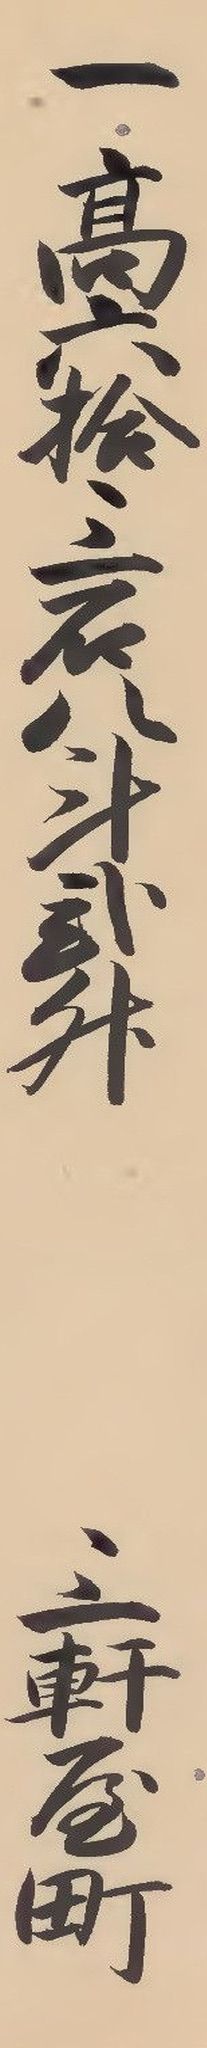一高六拾三石八斗弐升三軒屋町
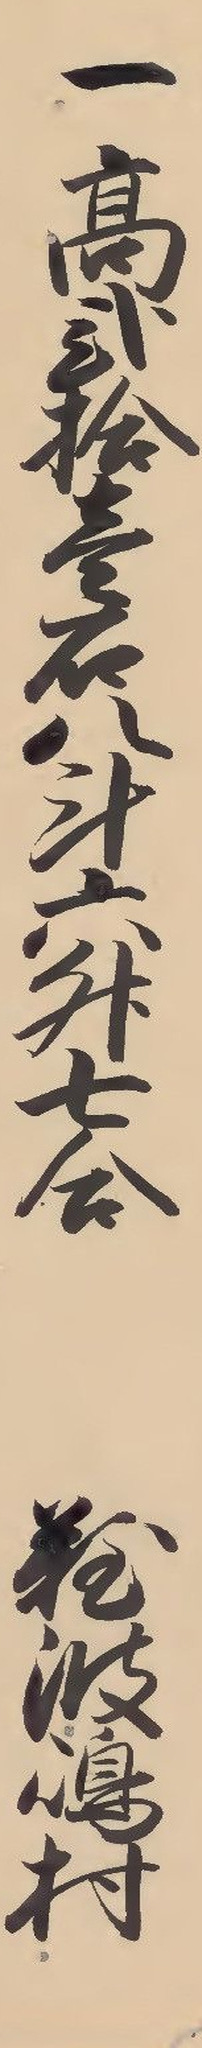一高弐拾壱石八斗六升七合難波島村
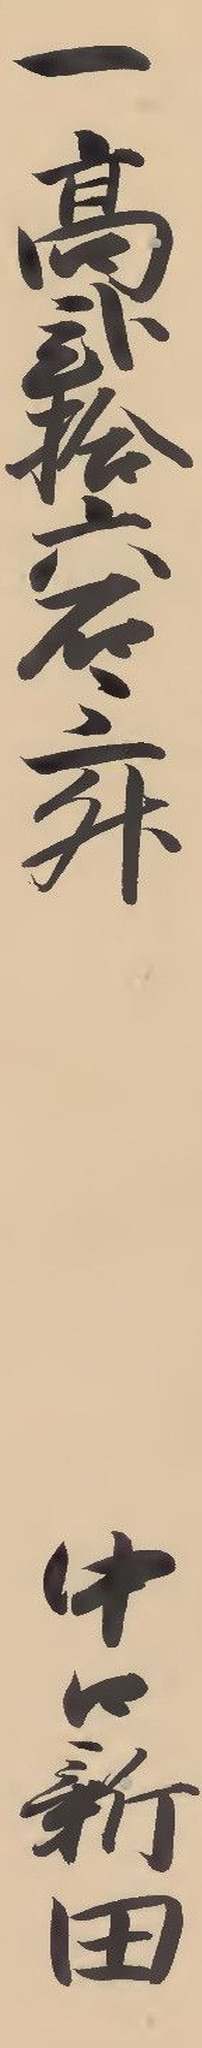一高弐拾六石三升中口新田
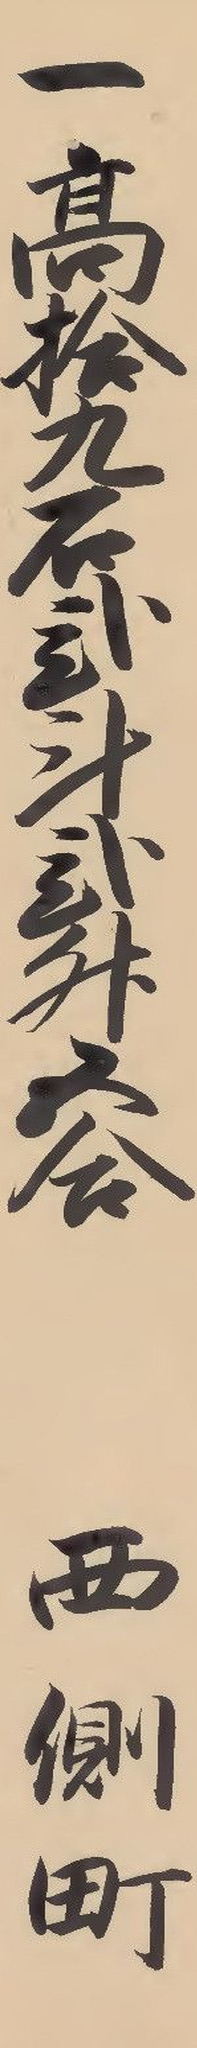一高拾九石弐斗弐升五合西側町
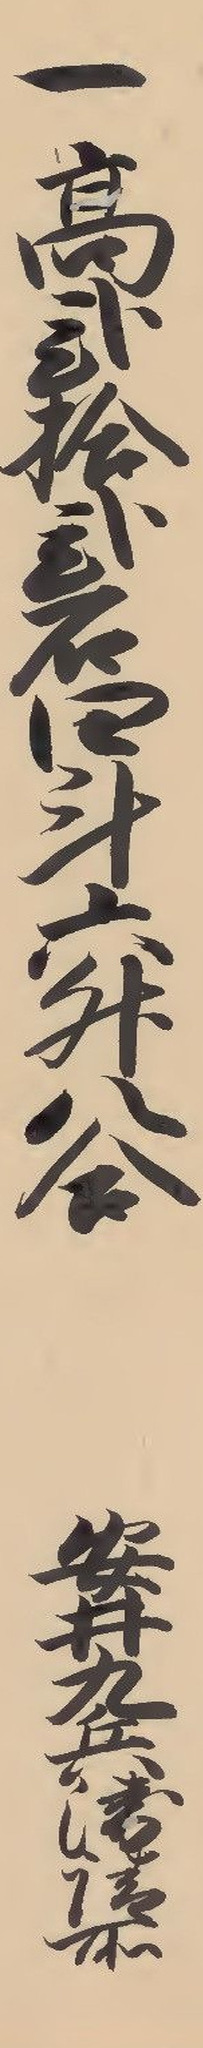一高弐拾弐石四斗六升八合安井九兵衛請所

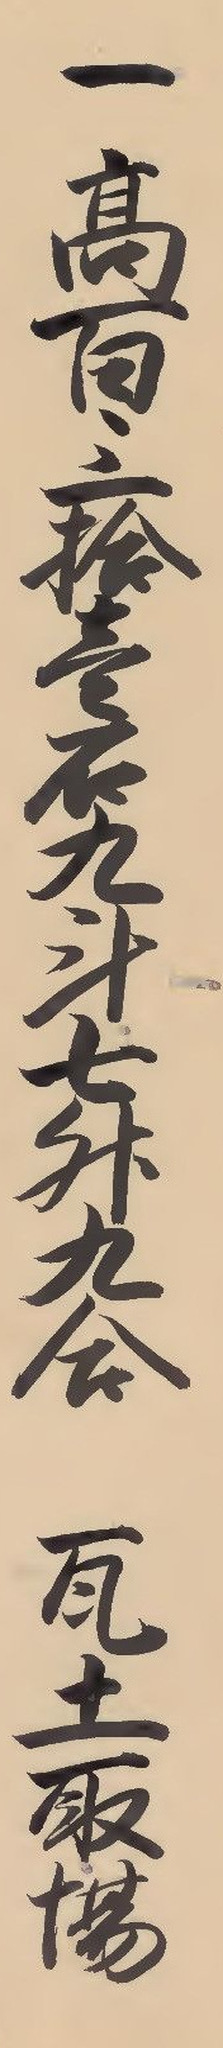一高百三拾壱石九斗七升九合瓦土取場
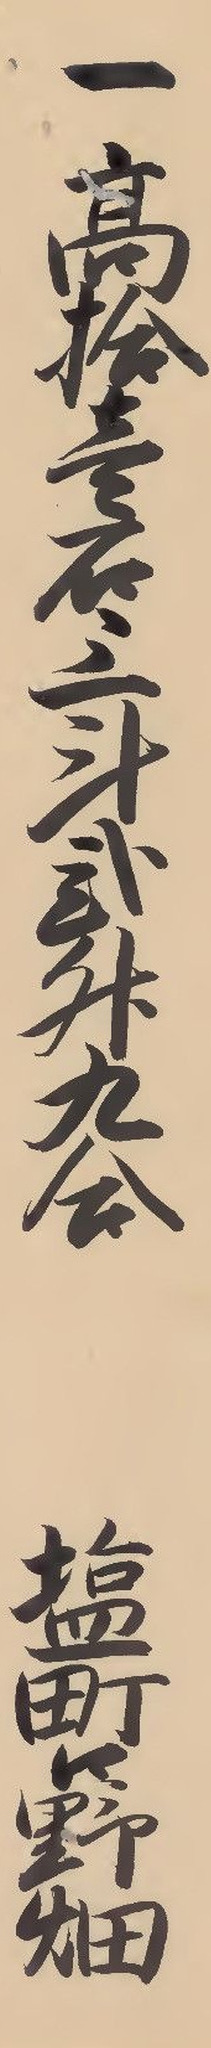一高拾壱石三斗弐升九合塩町口野畑
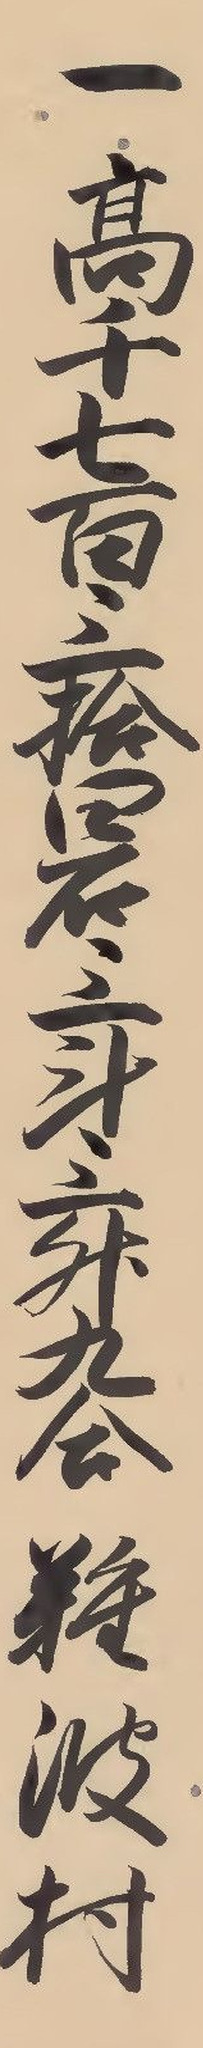一高千七百三拾四石三斗三升九合難波村
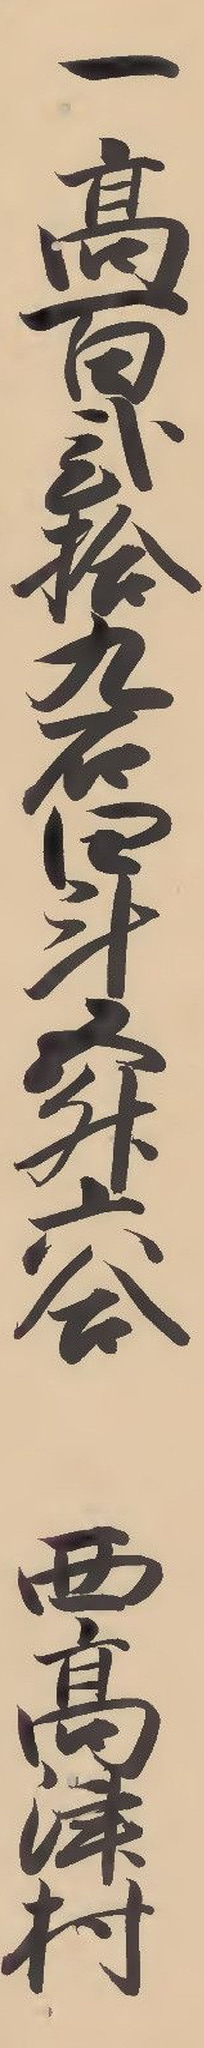一高百弐拾九石四斗五升六合西高津村
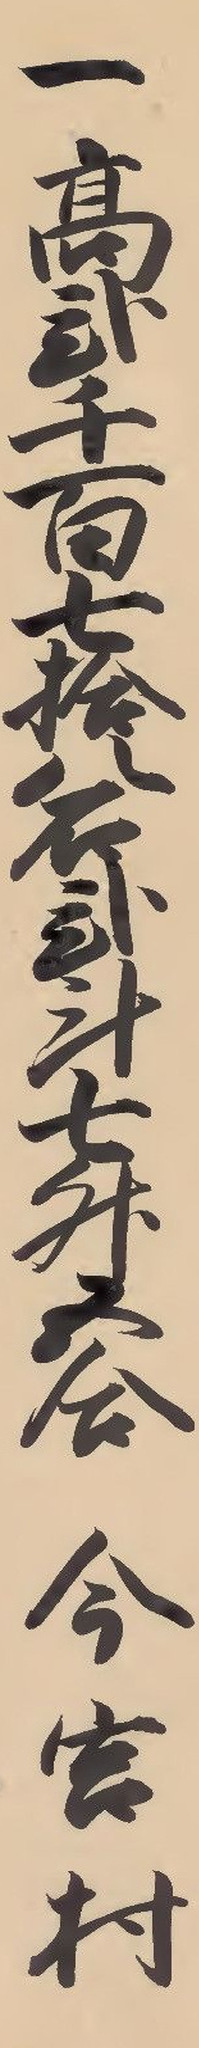一高弐千百七拾八石弐斗七升五合今宮村
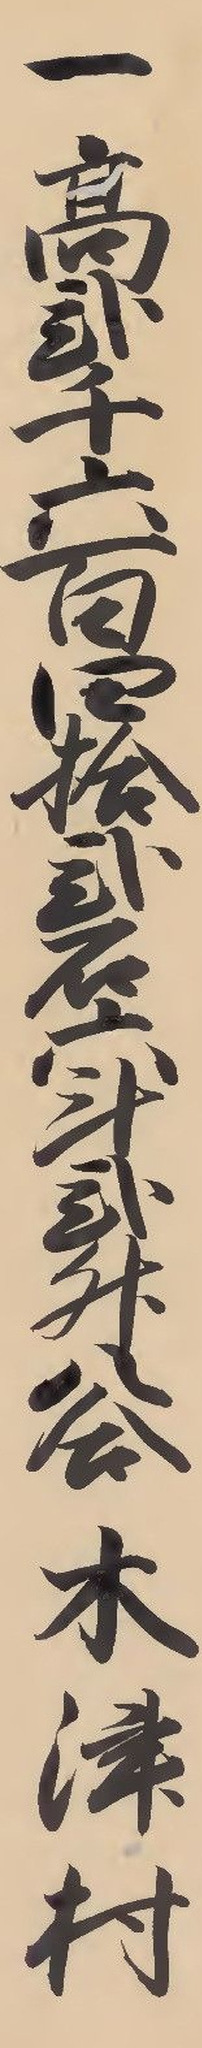一高弐千六百四拾弐石六斗弐升八合木津村
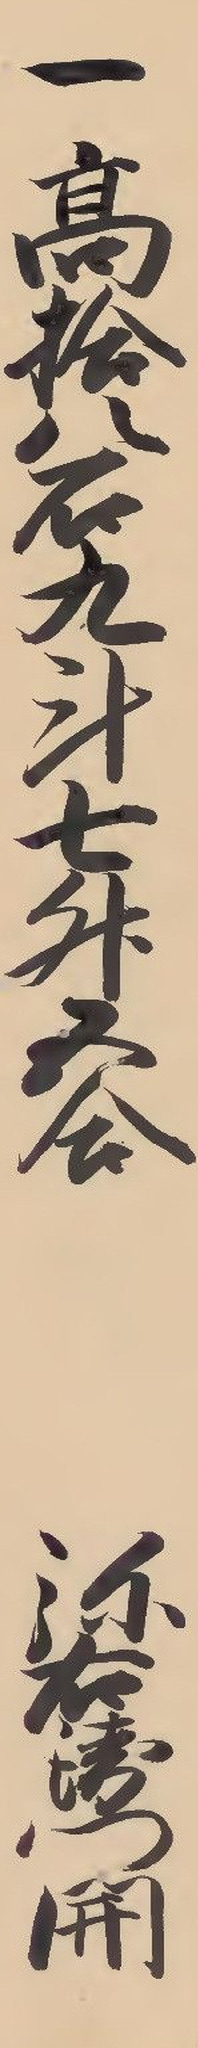一高拾八石九斗七升五合弥右衛門開

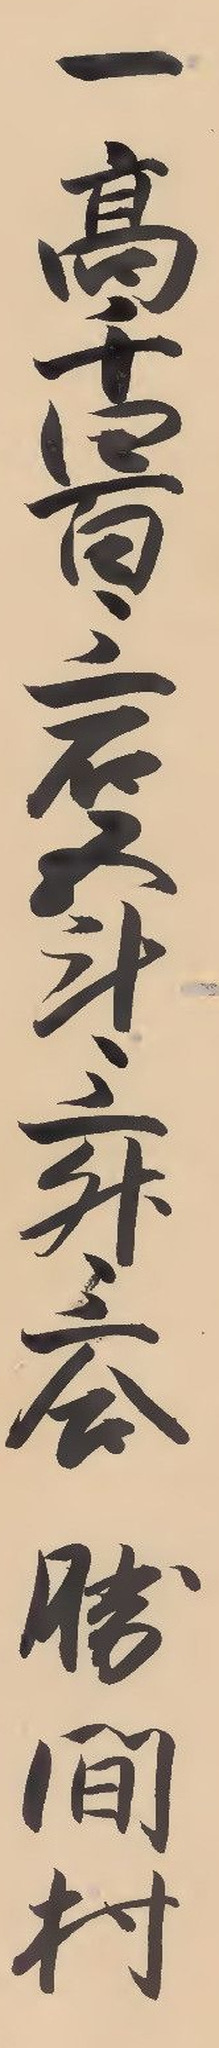一高千四百三石五斗三合勝間村
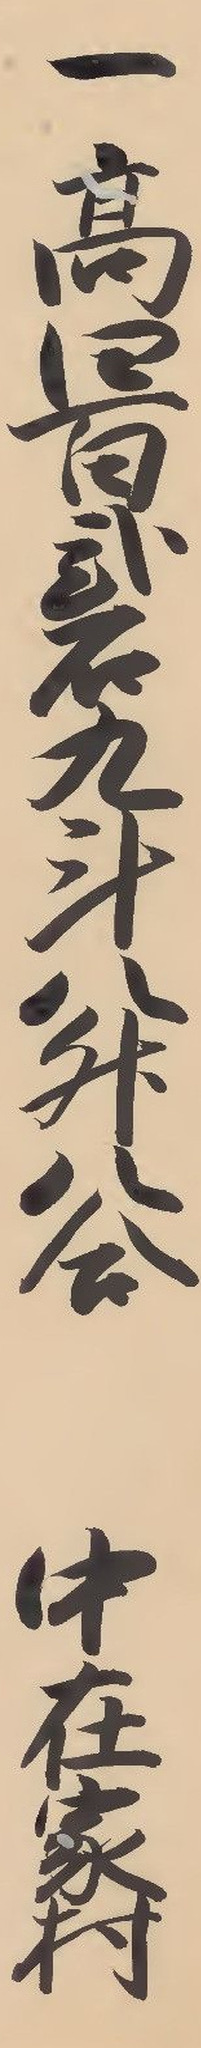一高四百弐石九斗八升八合中在家村
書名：摂津国郷帳
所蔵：国立公文書館 National Archives of Japan
